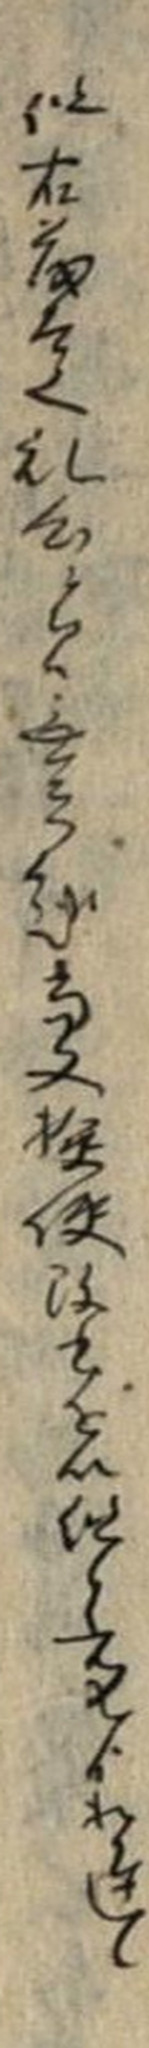但右茂大夫乱心にては無之趣尚又検使改書を以組之者共ゟ相達候

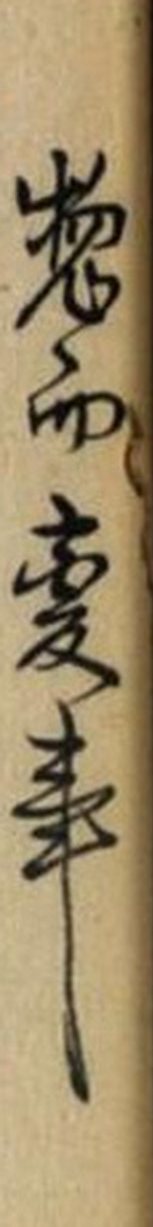惣て変事
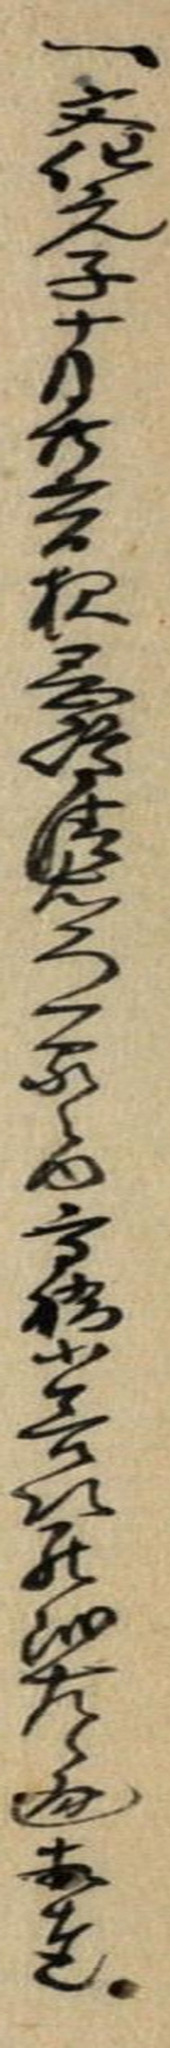一文化元子十月廿六日夜岡島清右衛門一家之内高橋小善次罷越左之通相達
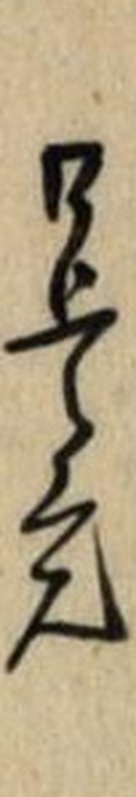口上之覚
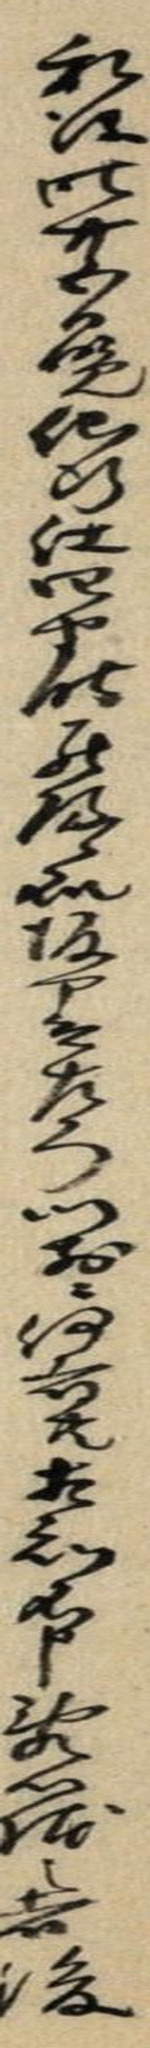私儀昨廿五日晩他行仕四半時罷帰候処坂部兵左衛門門前に何者共相知不申乱心体之者後
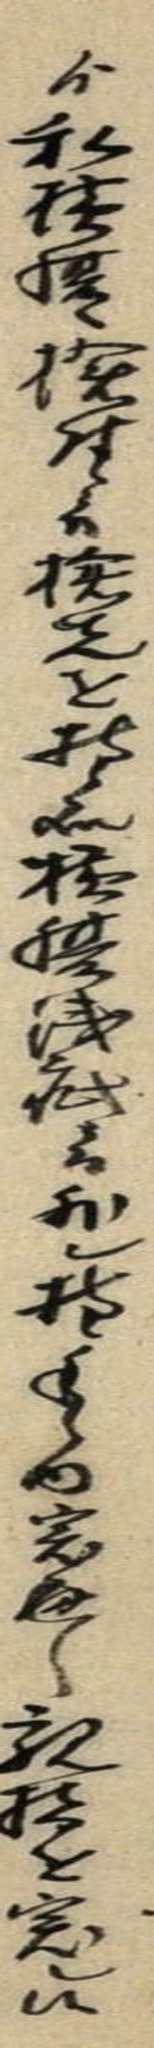ゟ私横腹へ槍付候に付槍先を持候処横腹浅疵にて外レ持候手之内突通し親指を突レ候
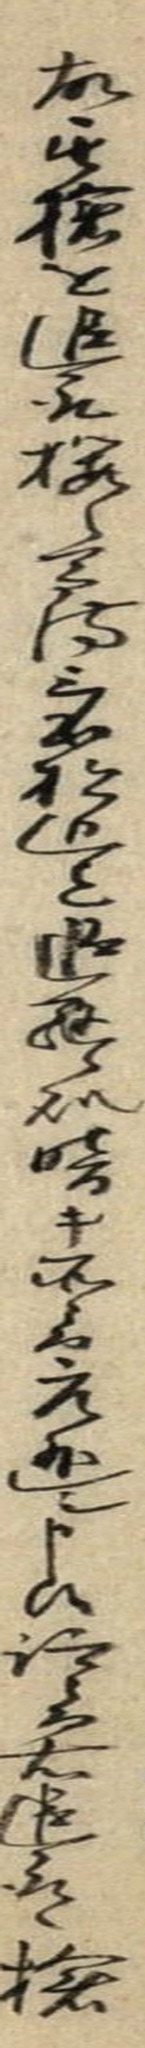故其槍を追取桜之馬場三本松辺迄追駆候処暗キ所にて取逃シ申候跡にて右追取候槍
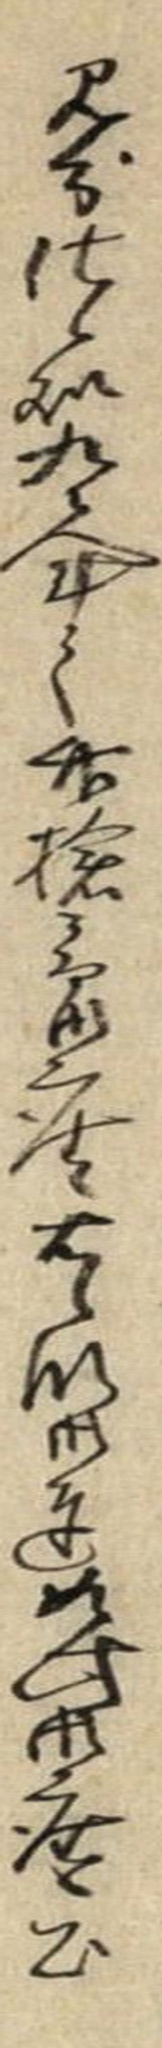見分仕候処九尺斗之竹槍にて御座候右之段御達如此御座候以上
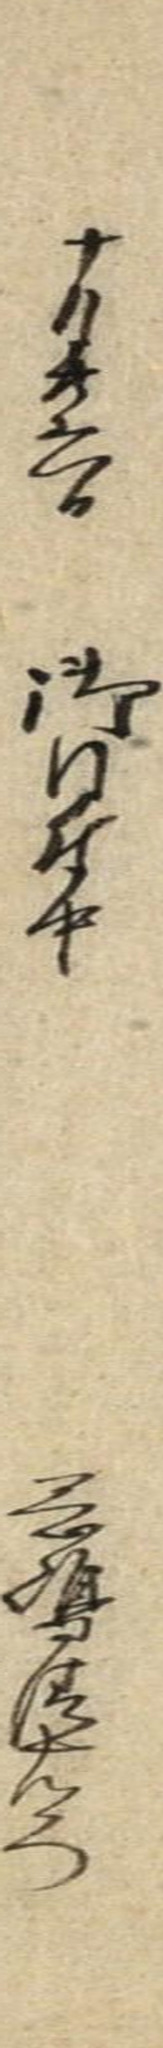十月廿六日御目付中岡島清右衛門
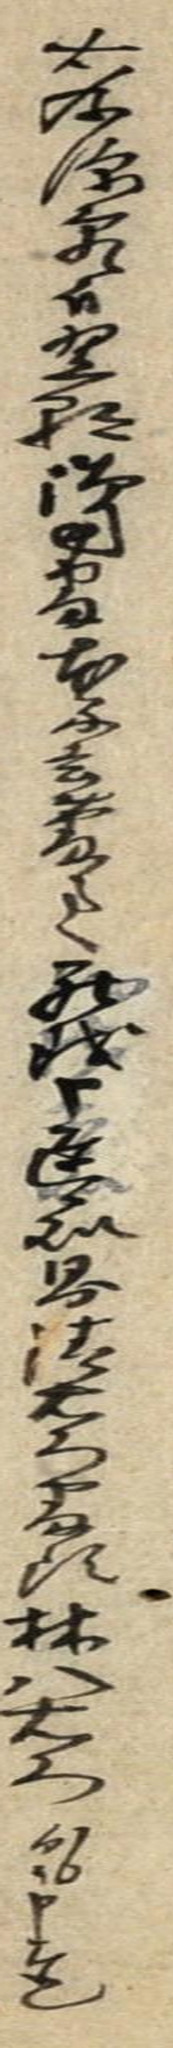右及深更候に付翌朝御用番本多玄蕃方へ罷越申達候処則清右衛門番頭林八右衛門ゟも申達
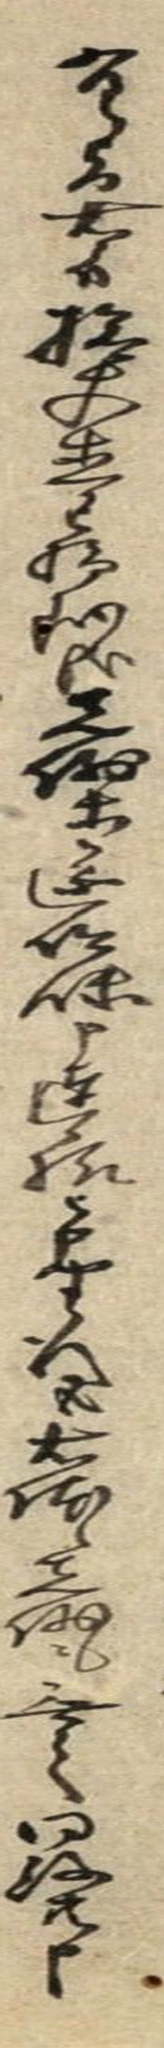有之旨右に付検使直に被指越哉先例等遂吟味申達候様被申聞候得共右体之先例も無之同役共申
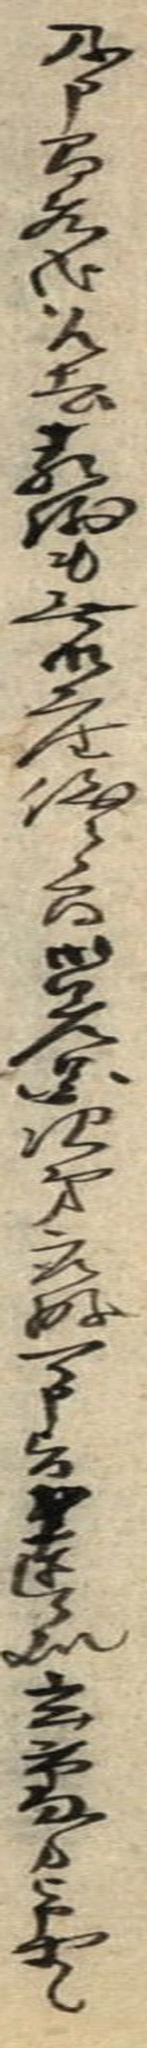及申間敷哉乍去類例も無御座儀に候間御差図次第取扱可申旨申達候処玄蕃方被申聞候
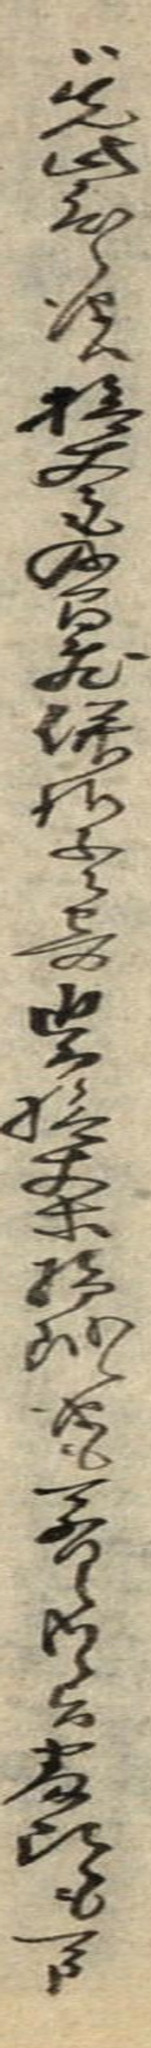は先此度之儀は検使にも及間敷併様子に寄追て検使等指越候儀も可有之哉之旨番頭へも可申
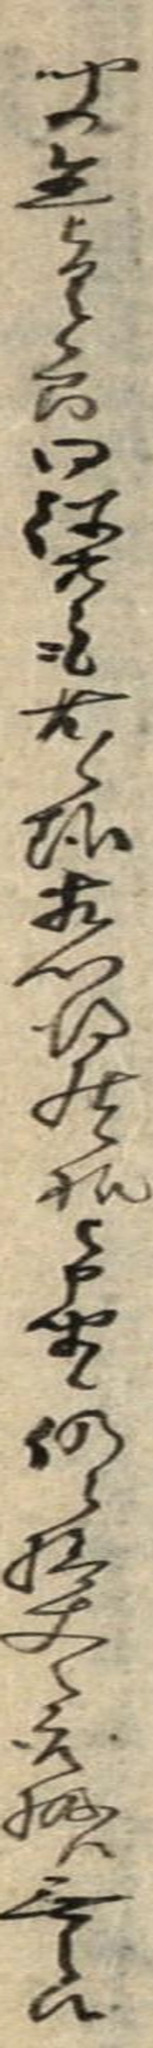聞置被申候間同役共にも右之趣相心得居候様被申聞候仍之検使之取扱は無之候
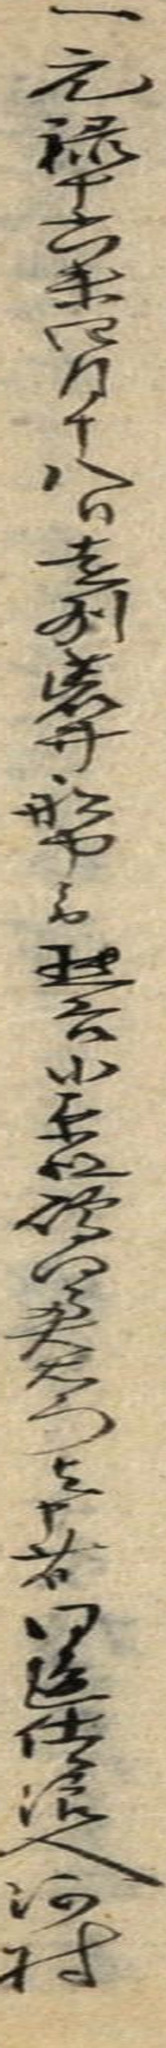一元禄十六未四月十八日遠州荒井船中にて熊谷小兵衛組島田奥右衛門と申者同道仕候浪人河村
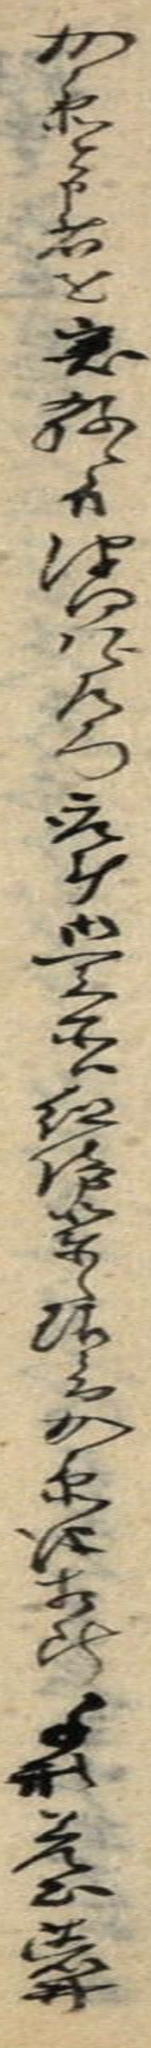加兵衛と申者を突殺候に付津田八郎左衛門取斗御関所は組傍輩之趣にて加兵衛儀相断手形差出荒井
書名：御停止異変死失
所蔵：福井県文書館 Fukui Prefectural Archives
